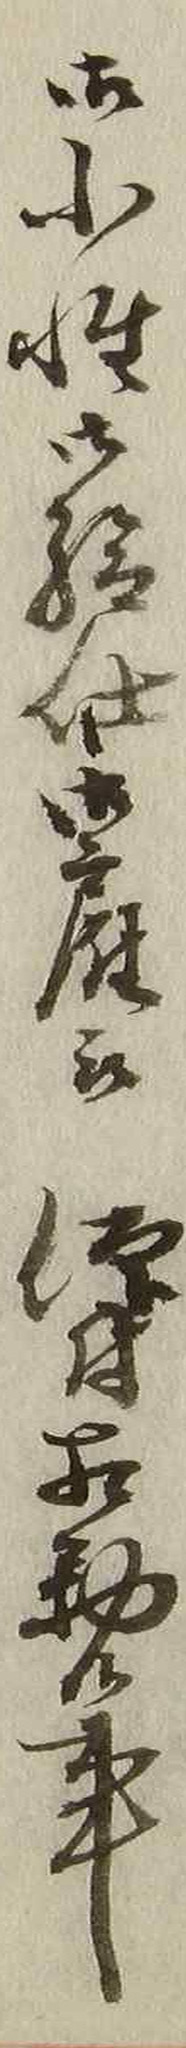御小性御給仕御雇被仰付相勤候事
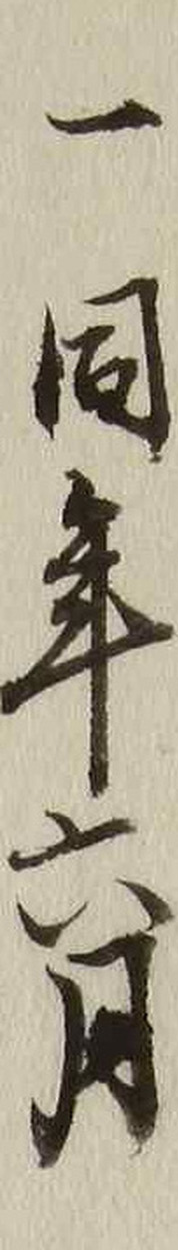一同年六月
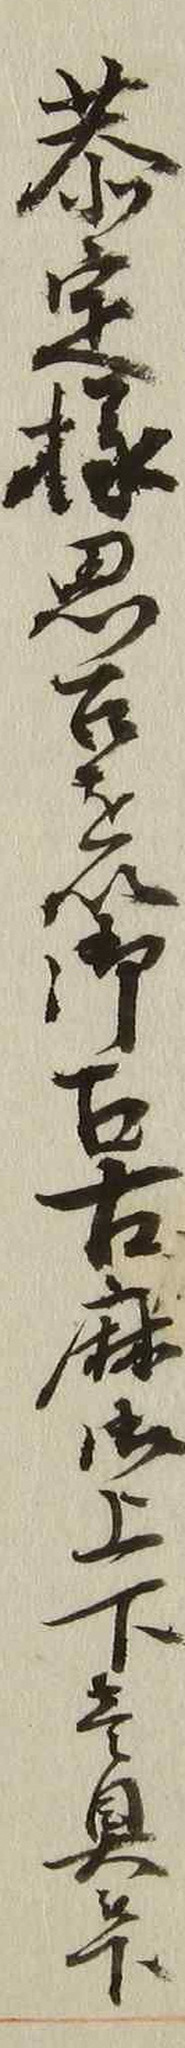恭定様思召を以御召古麻御上下壱具被下
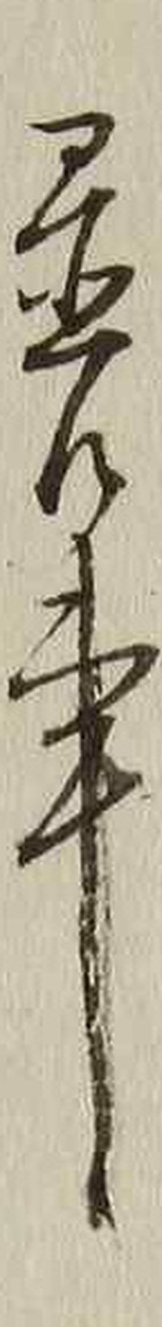置候事
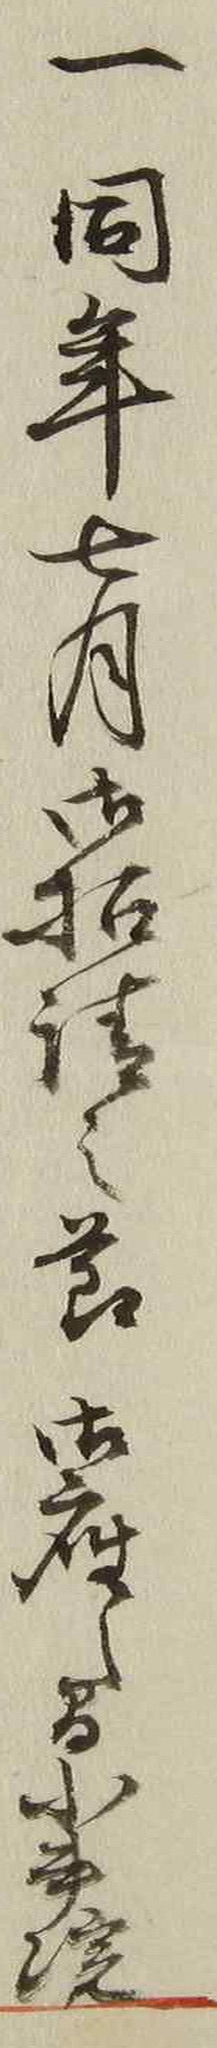一同年七月御招請之節御座之間小事院
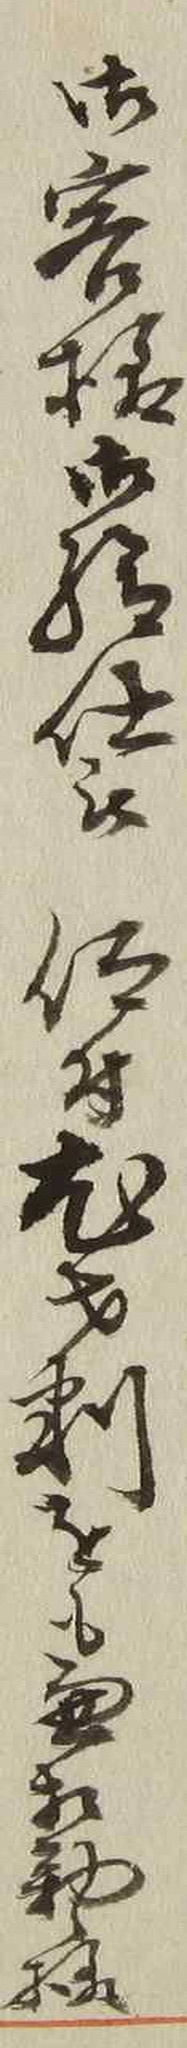御客様御給仕被仰付尤才判をも兼相勤候様
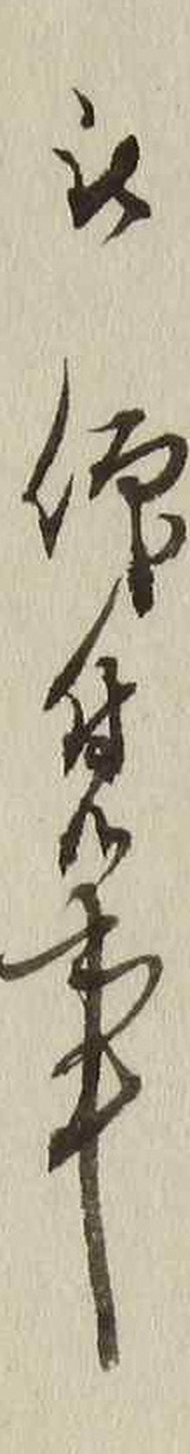被仰付候事
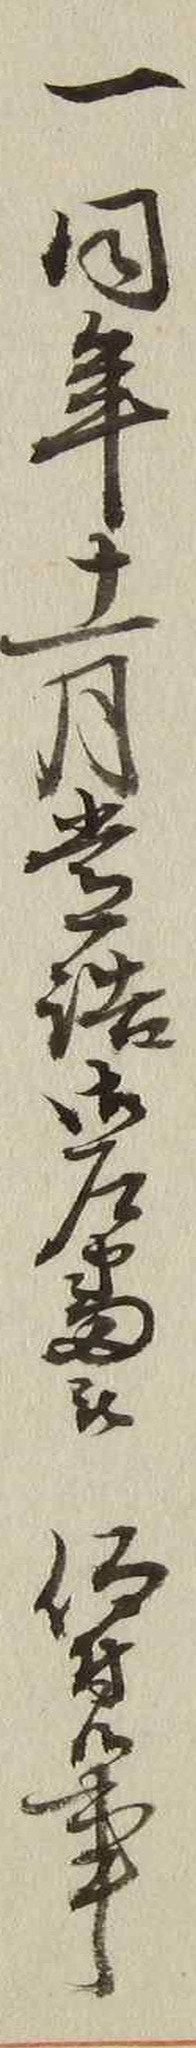一同年十一月常詰御戸番被仰付候事
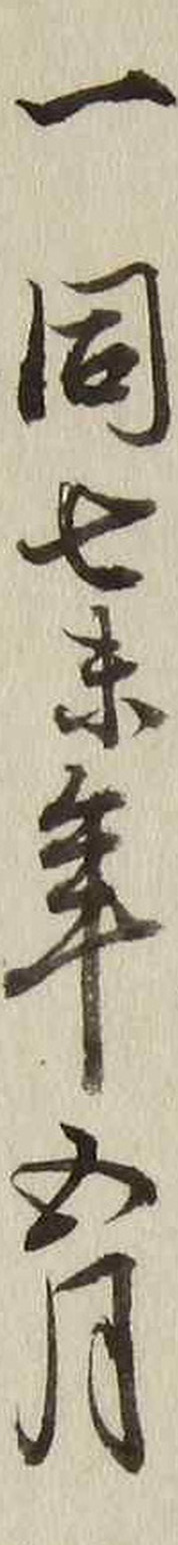一同七未年五月
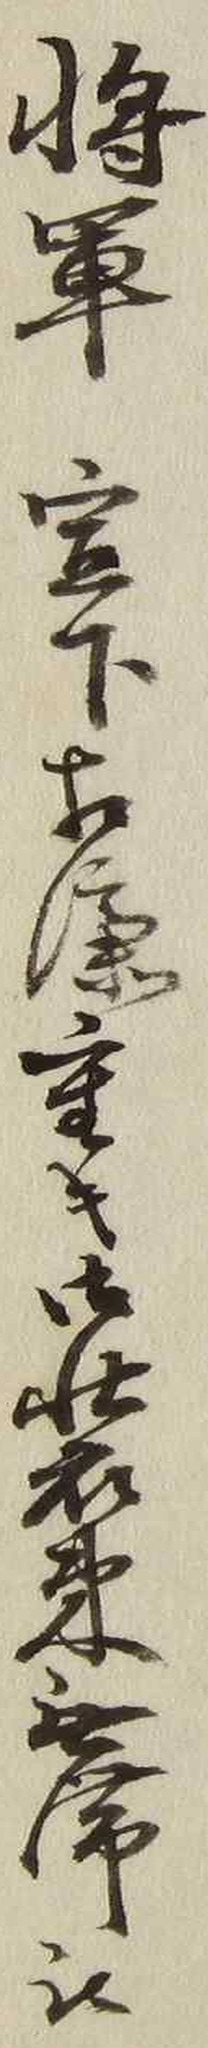将軍宣下相済重キ御装束無滞被
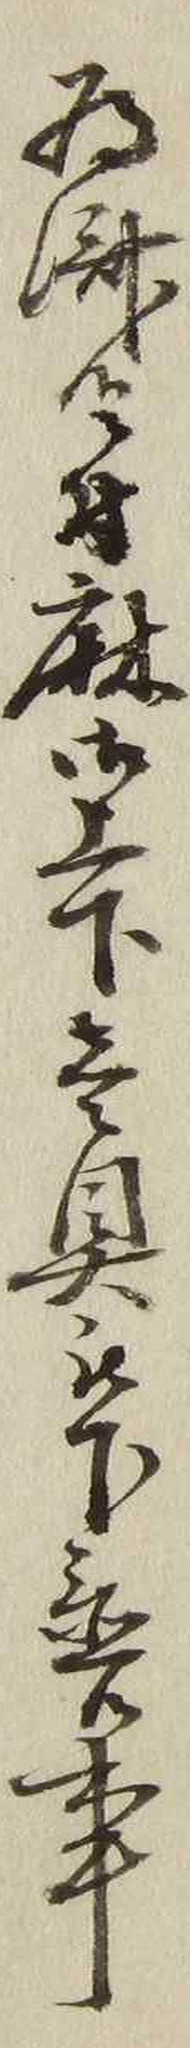為済候ニ付麻御上下壱具被下置候事
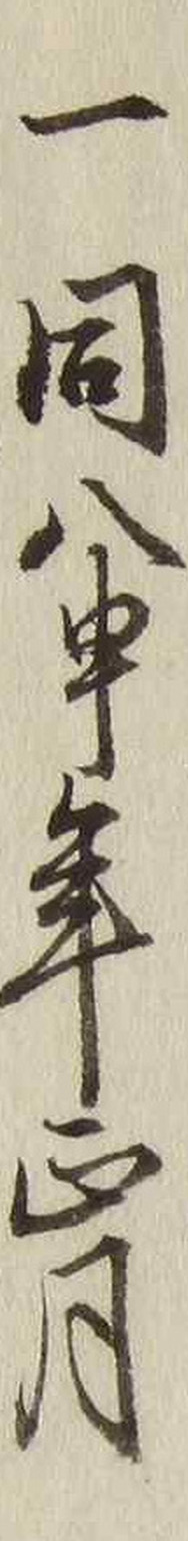一同八申年正月
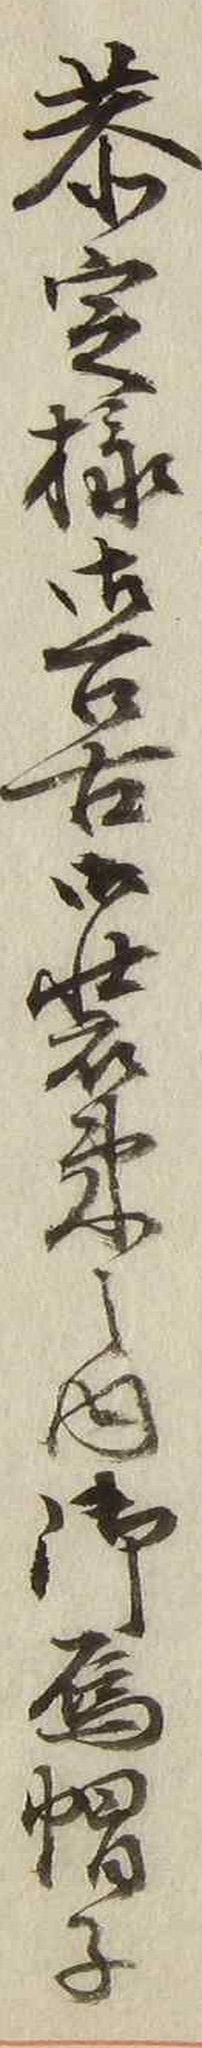恭定様御召古御装束之内御烏帽子
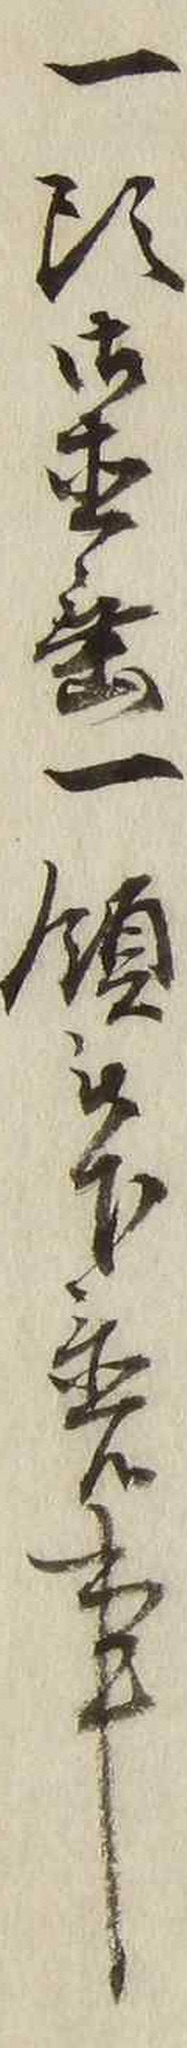一頭御直垂一領被下置候事

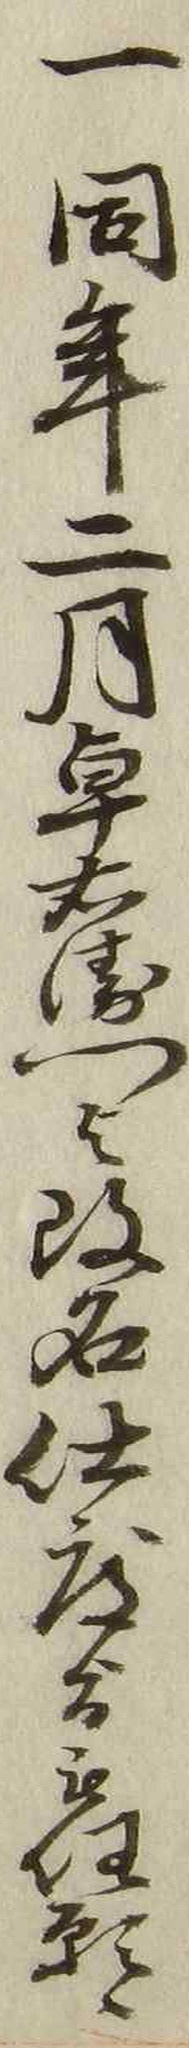一同年二月卓右衛門与改名仕度旨被任願候
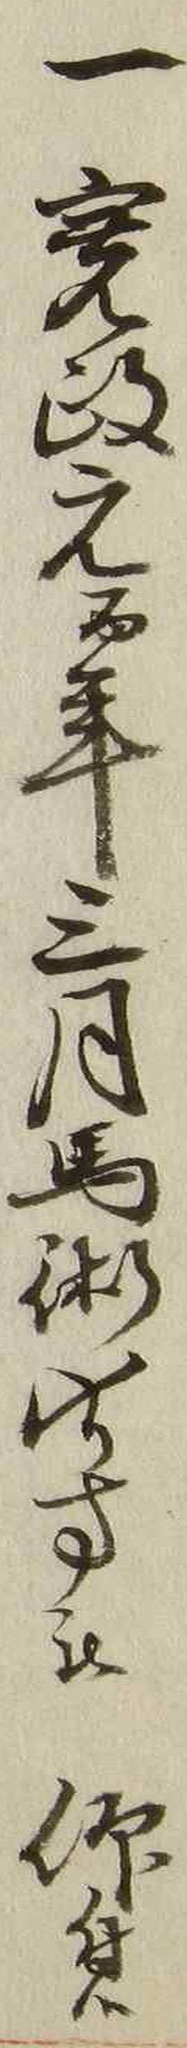一寛政元年酉年三月馬術〆り方被仰付候
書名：諸士系譜　巻之23　い之部23
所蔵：会津若松市立会津図書館
